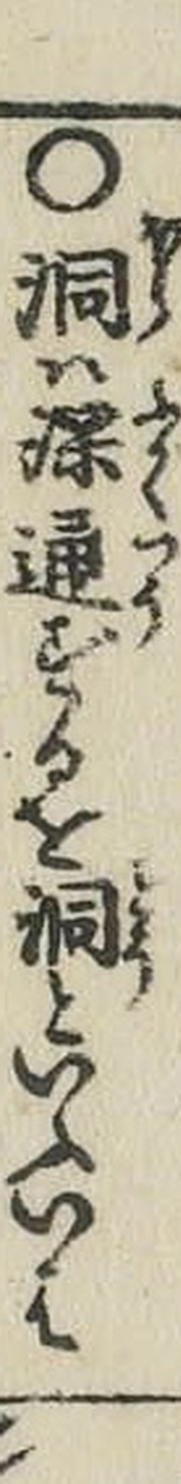○洞は深通ずるを洞といふいは
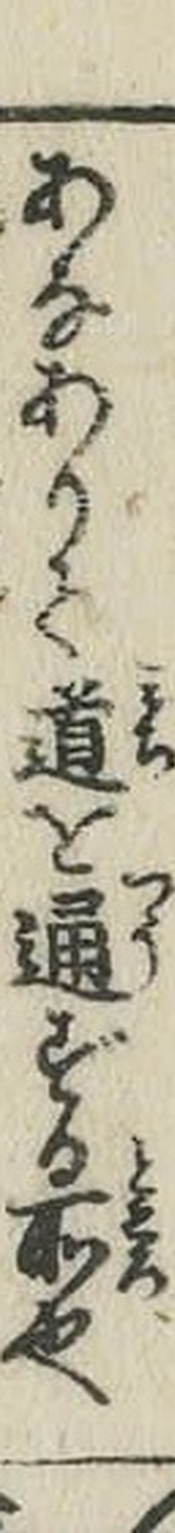あなありて道を通ずる所也
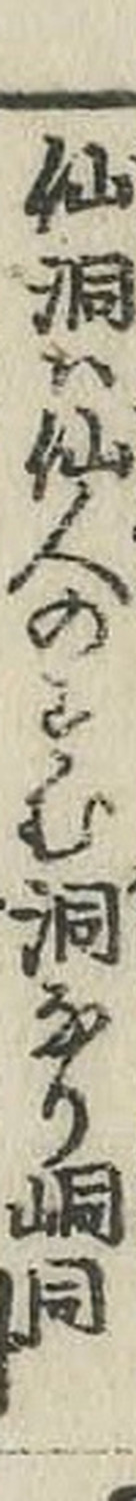仙洞は仙人のすむ洞なり峒同じ
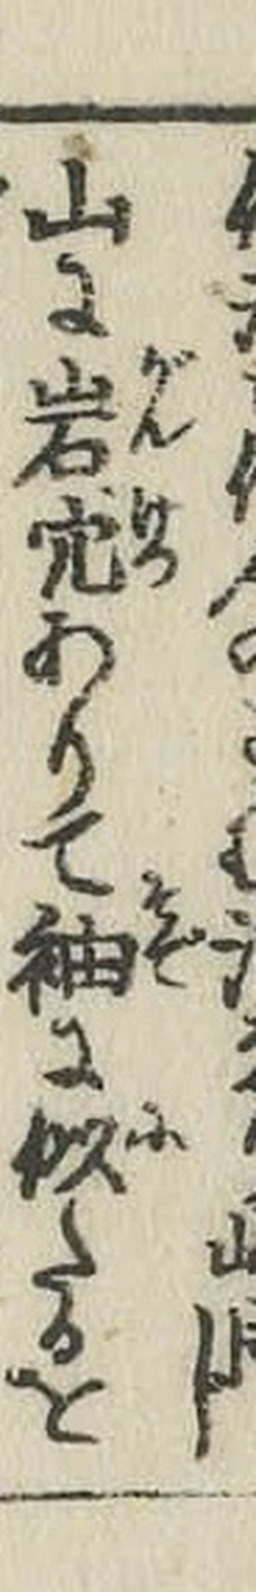山に岩穴ありて袖に似たるを
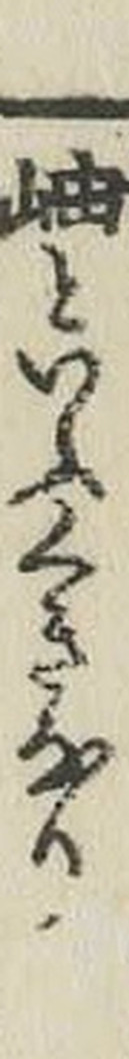岫といふくきなり
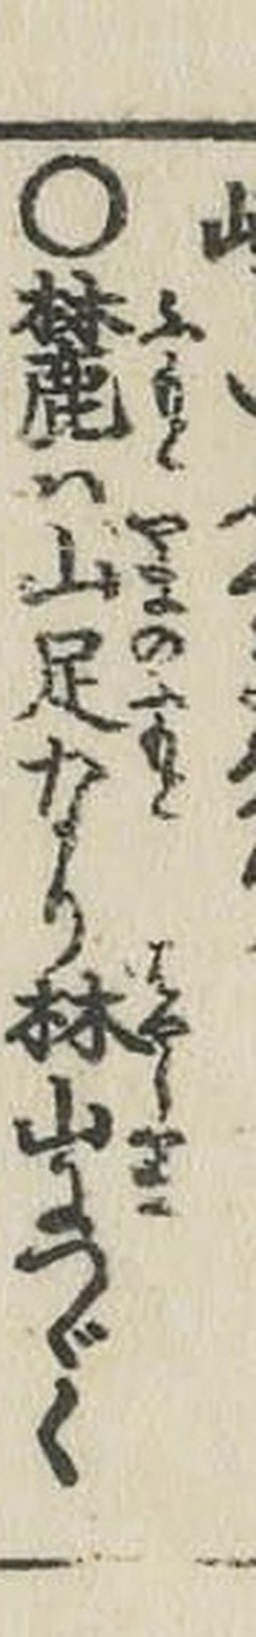○麓は山足なり林山につゞく
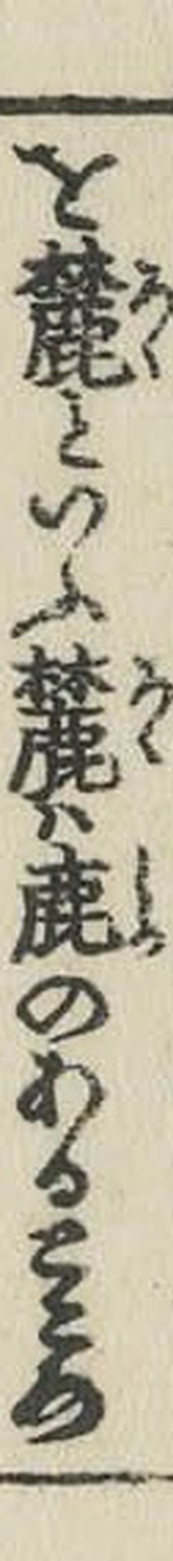を麓といふ麓は鹿のあるところ
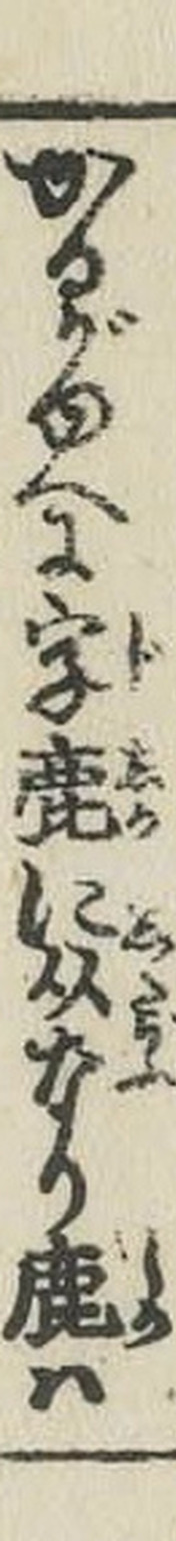かるがゆへに字鹿に従なり鹿は
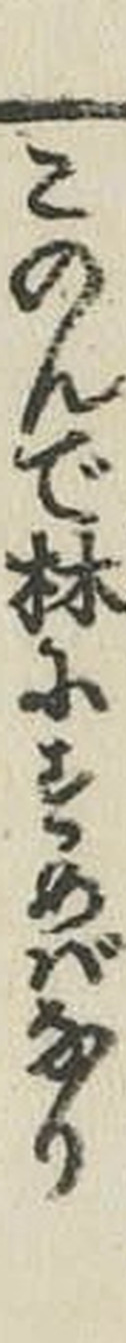このんで林にすめばなり
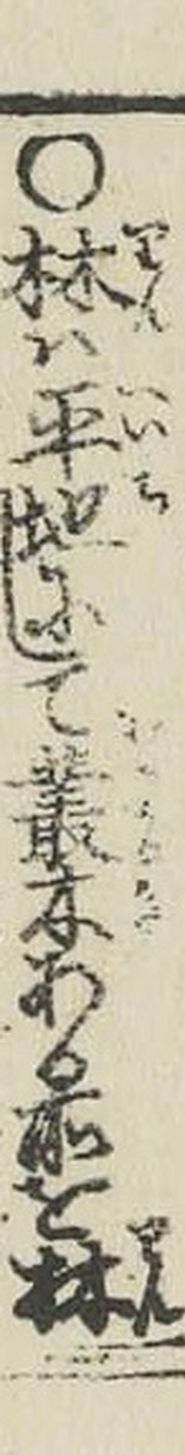○林は平地にして叢木ある所を林
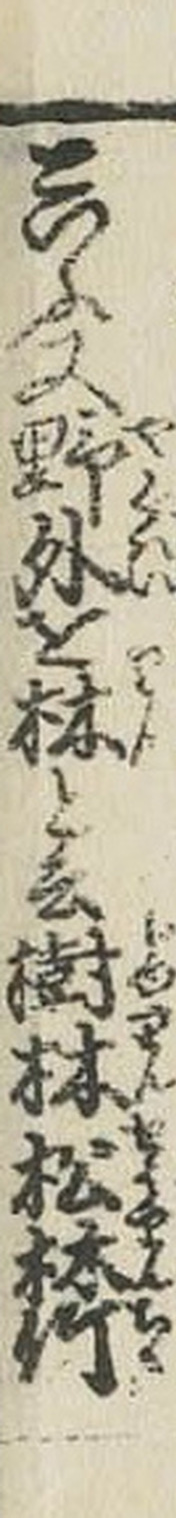といふ又野外を林と云樹林松林竹
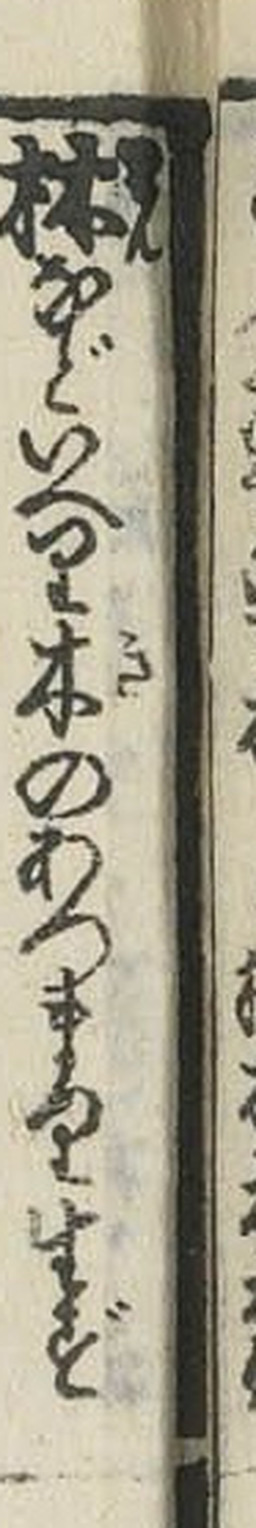林などいへり木のあつまり生ず
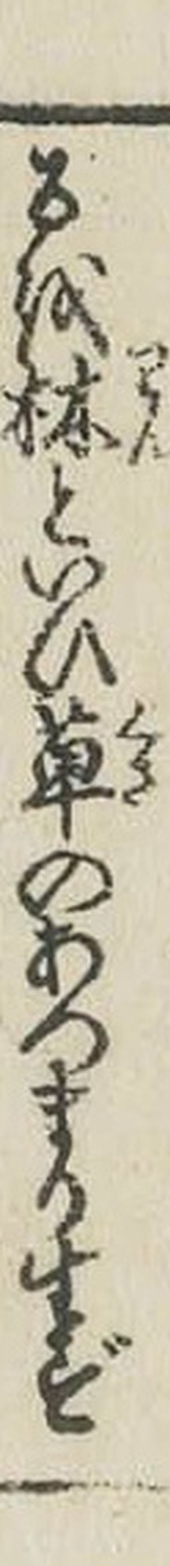るを林といひ草あつまり生ず
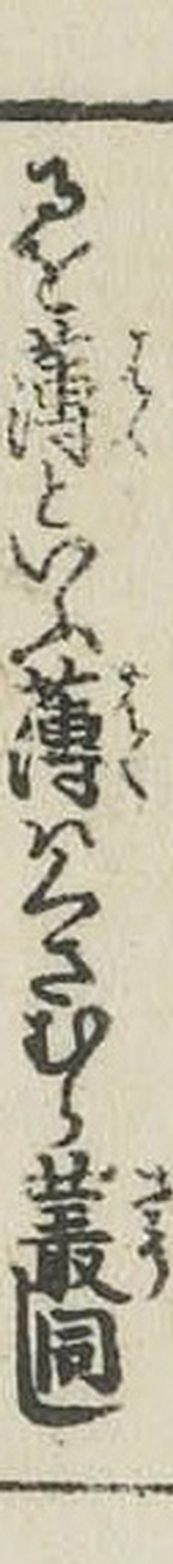るを薄といふ薄はくさむら叢同し。
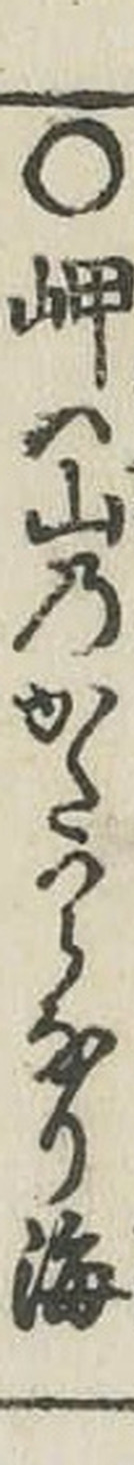○岬は山のかたはらなり海
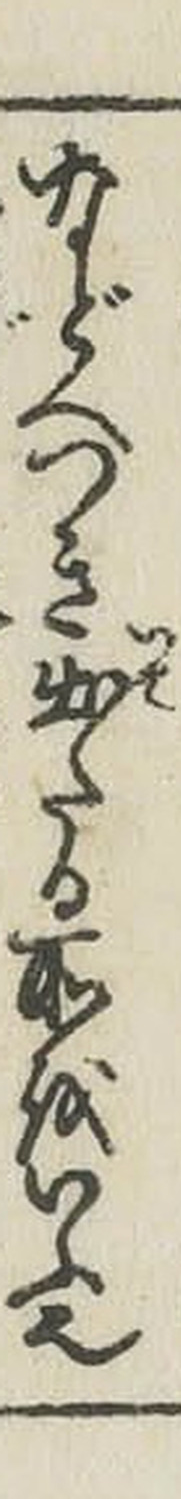などへつき出たる所をいふ也
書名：増補頭書訓蒙図彙大成 10巻 2:巻之1-3
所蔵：東京学芸大学教育コンテンツアーカイブ
